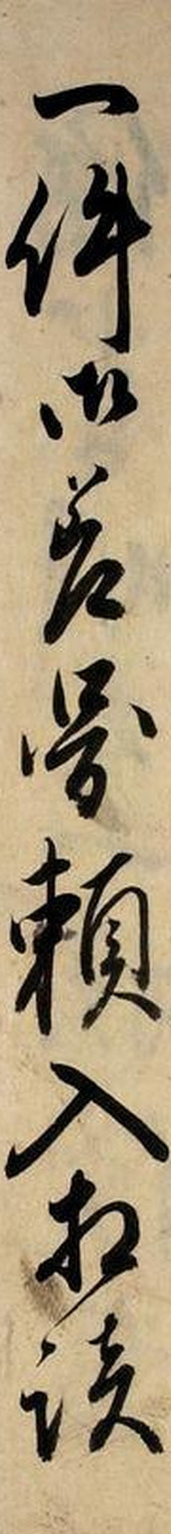一件御差図頼入相談
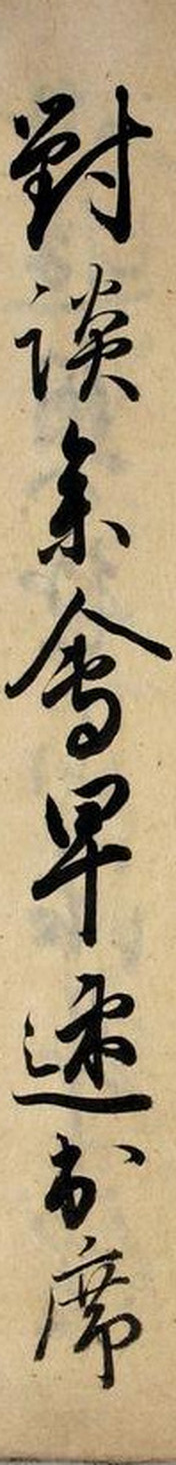対談参会早速出席
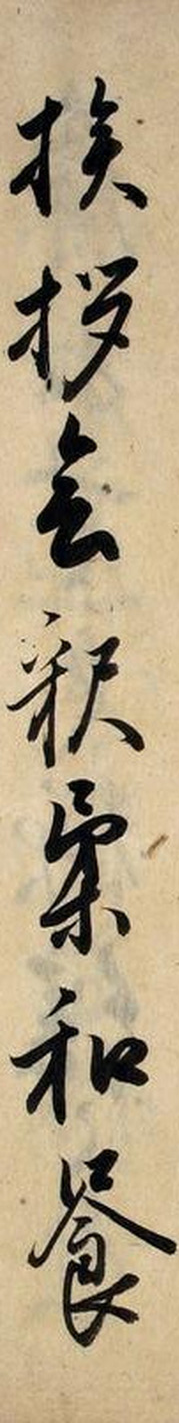挨拶会釈柔和饗
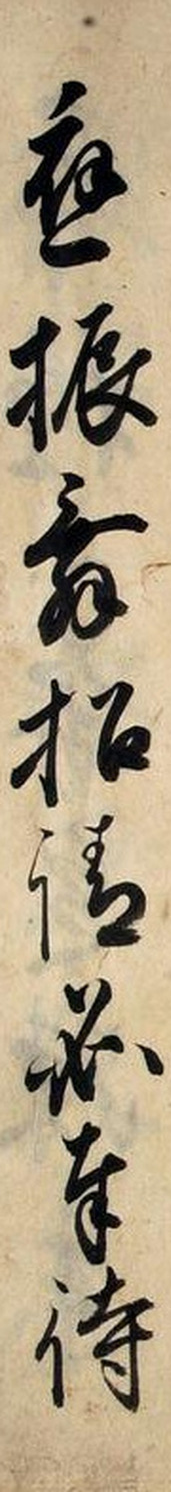応振舞招請必奉待

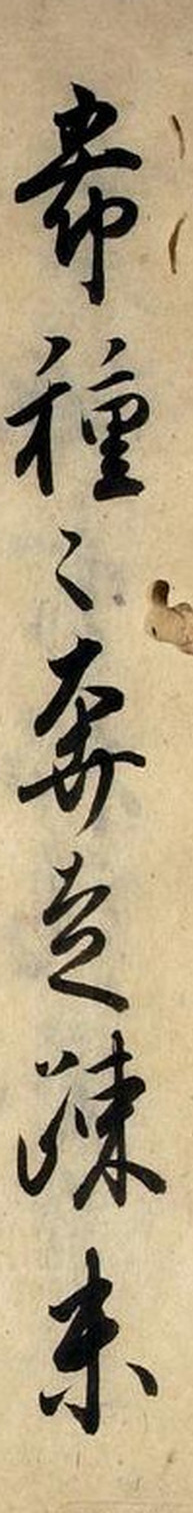希種々奔走疎末
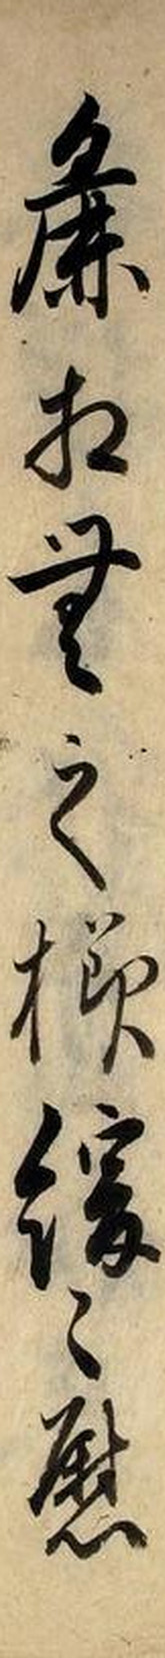麁相無之様緩々慰
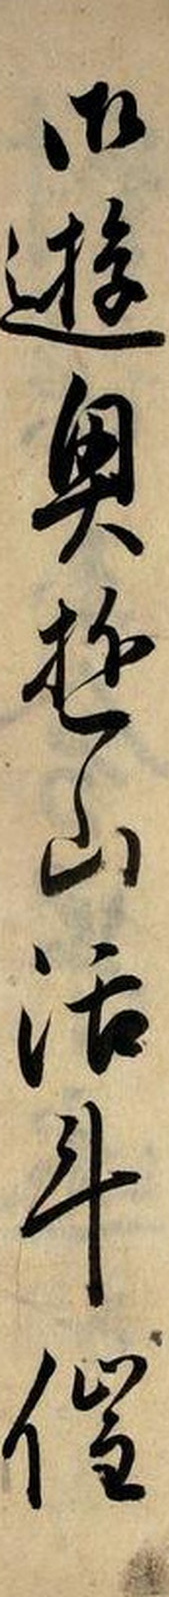御遊興遊山活計催
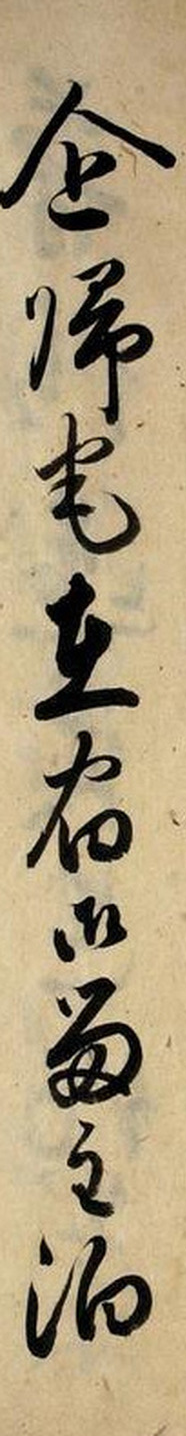企帰宅在宿御留主泊
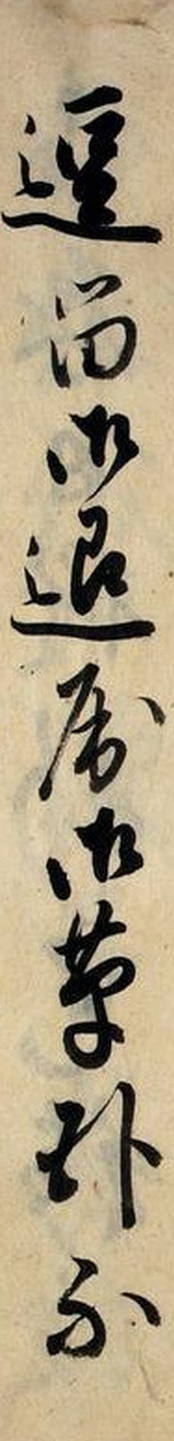逗留御退屈御草臥不
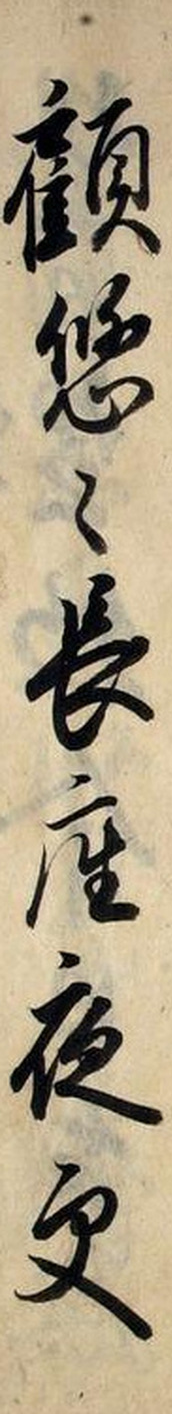顧悠々長座夜更

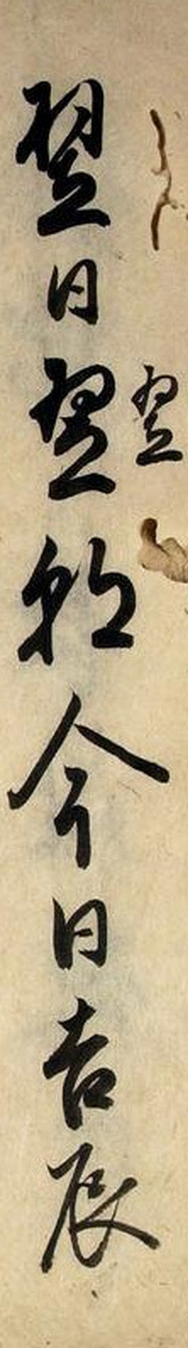翌日翌朝今日吉辰
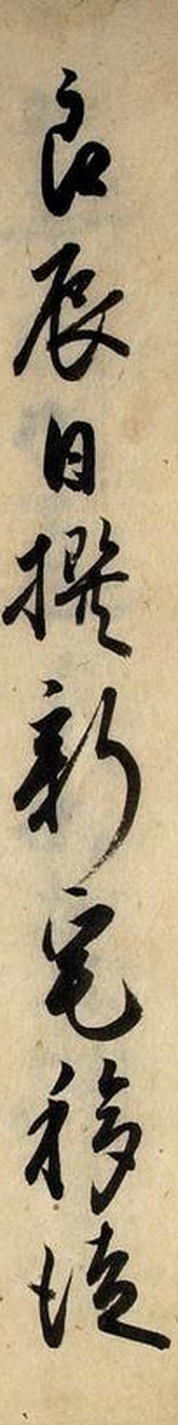良辰日撰新宅移徒
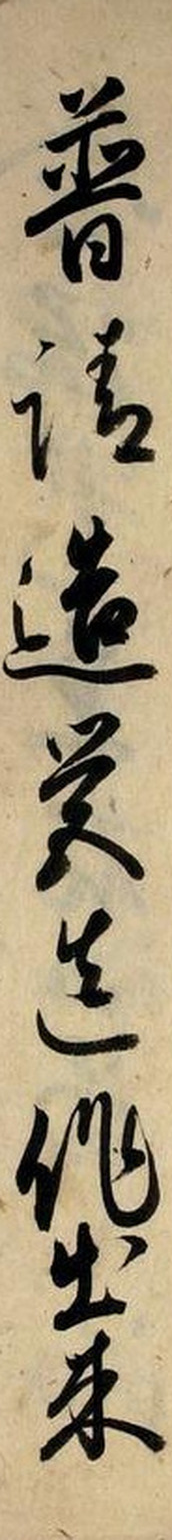普請造営造作出来
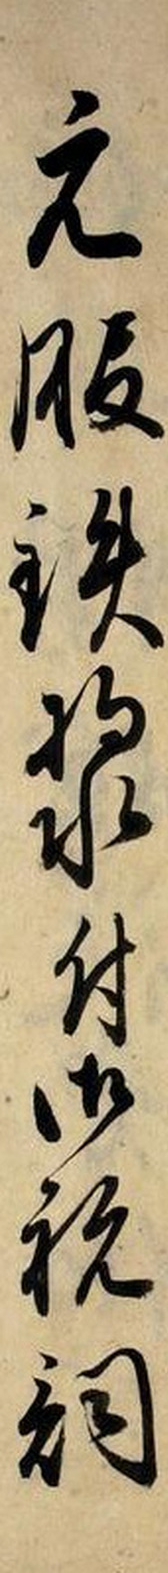元服鉄漿付御祝詞
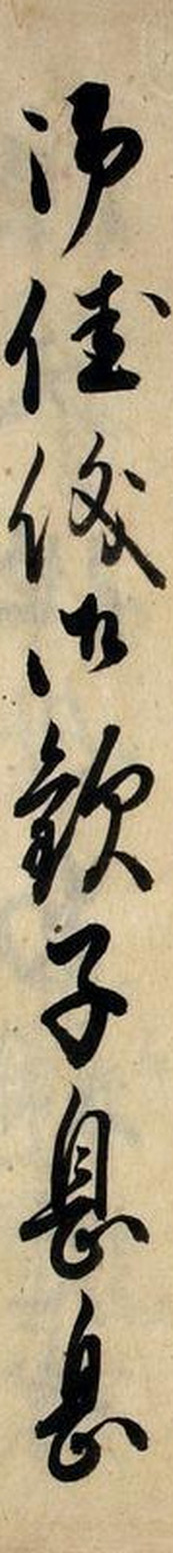御佳儀御歓子息息
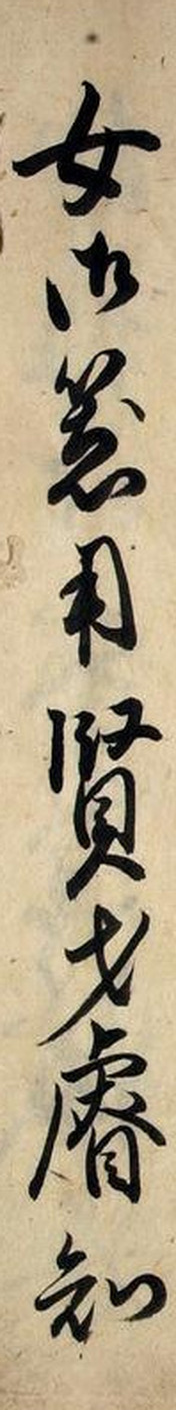女御器用賢才睿知
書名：消息千字文（往来物、手習手本）
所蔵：福井県文書館 Fukui Prefectural Archives
